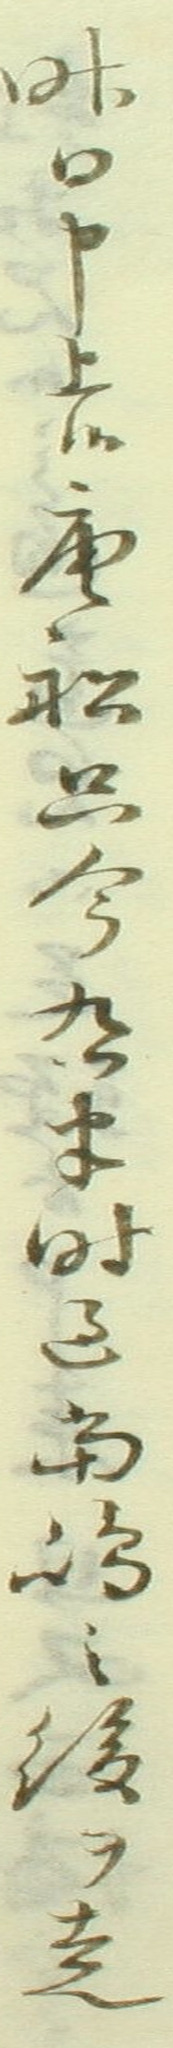昨日申上候唐船只今九ッ半時過当嶋之後を走
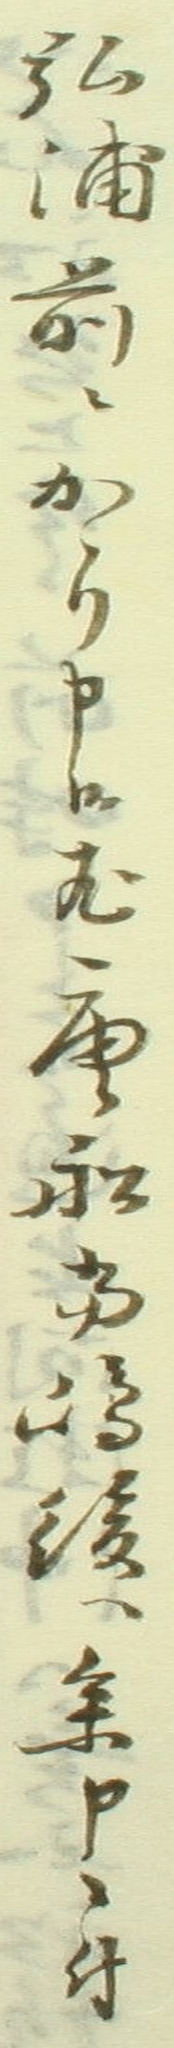弘浦前にかゝり申候尤唐船当嶋後へ参申に付
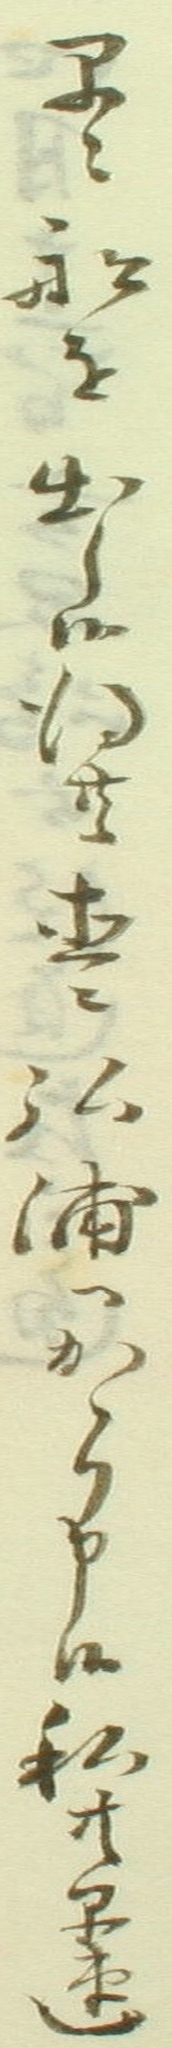早々船を出し候得共直に弘浦へかゝり申候私共早速
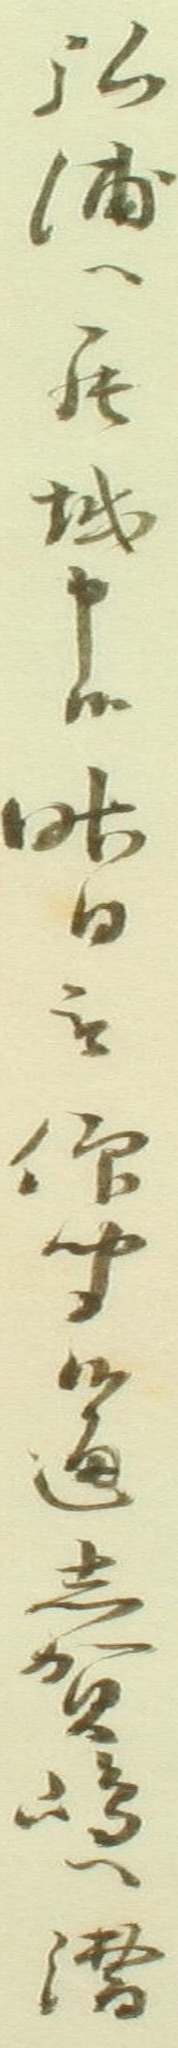弘浦へ罷越申候昨日被仰聞候通志賀嶋へ漕
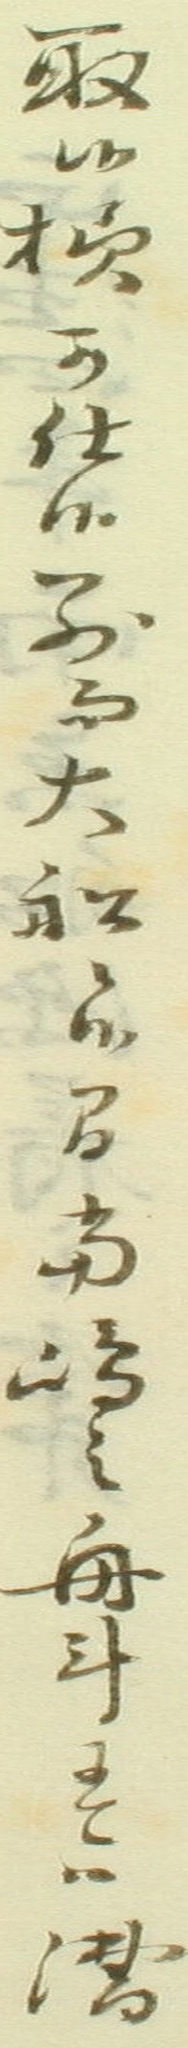取候様可仕候別而大船に候間当嶋之舟計にては漕
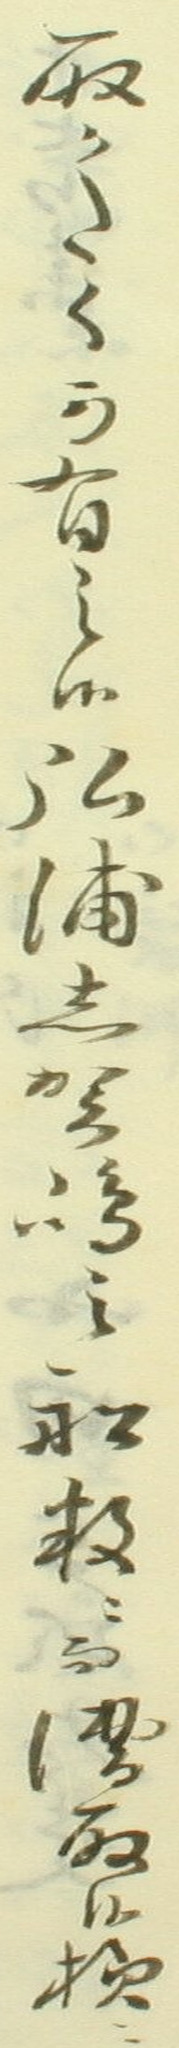取かたく可有之候弘浦志賀嶋之船数に而漕取候様
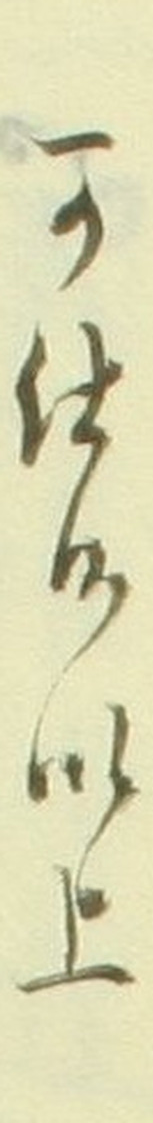可仕候以上
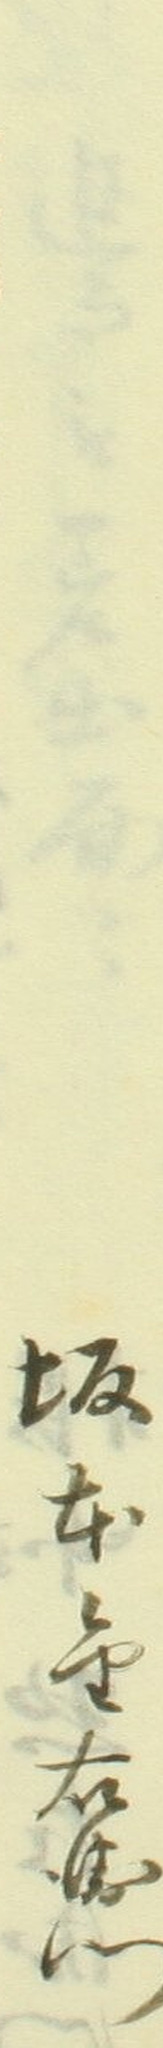坂本金右衛門
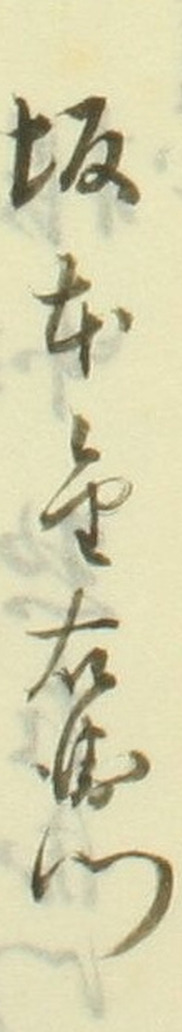坂本金右衛門
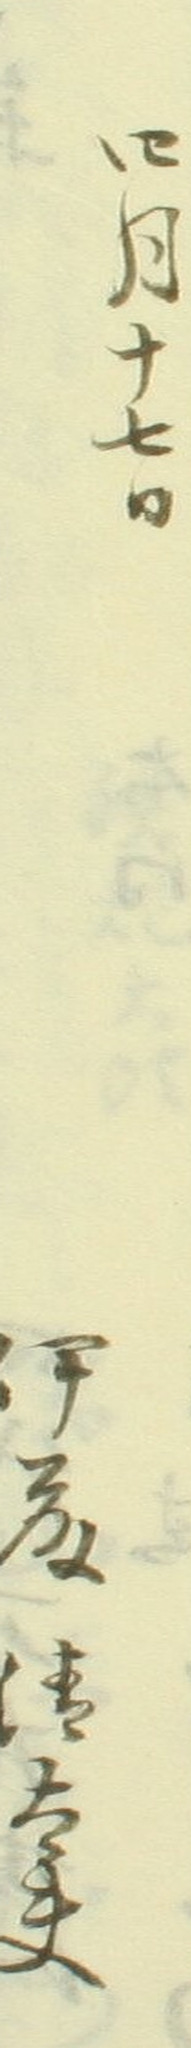四月十七日伊藤清太夫
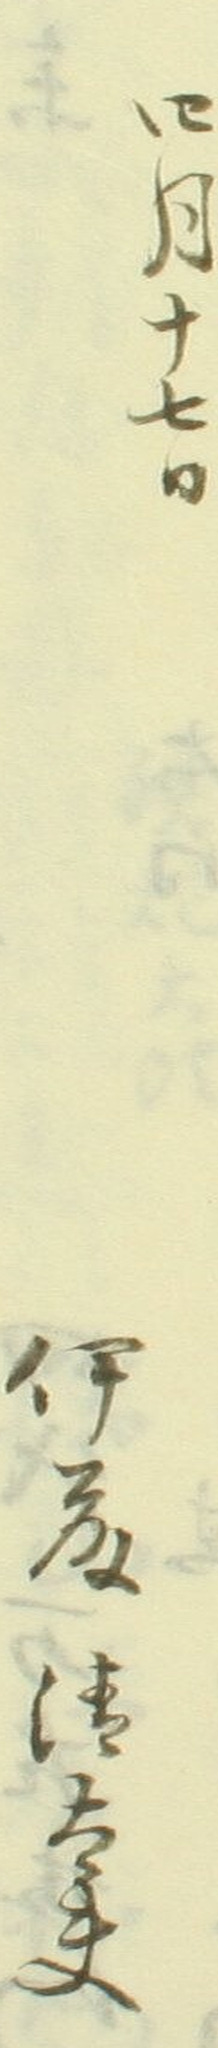四月十七日伊藤清太夫
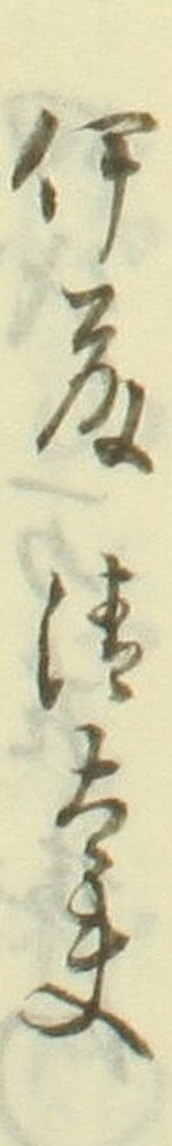伊藤清太夫
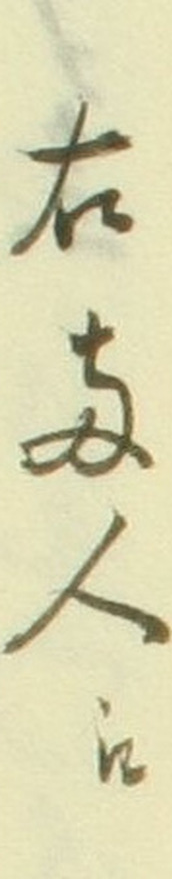右両人え
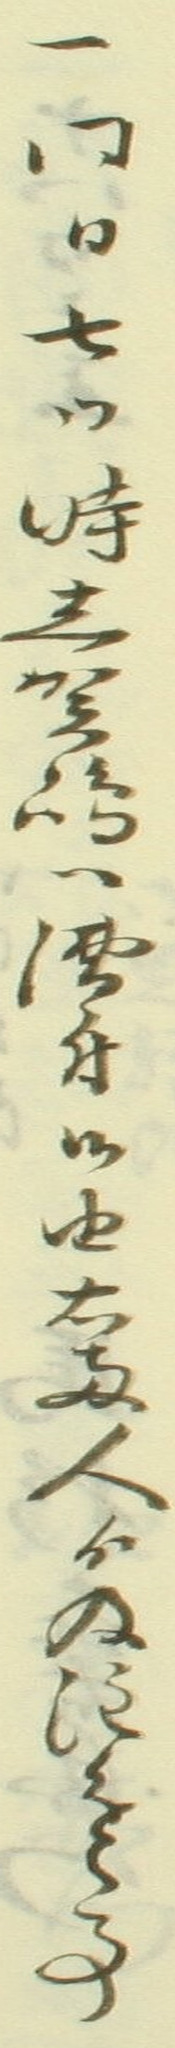一同日七ッ時志賀嶋へ漕付候由右両人ゟ及注進候事
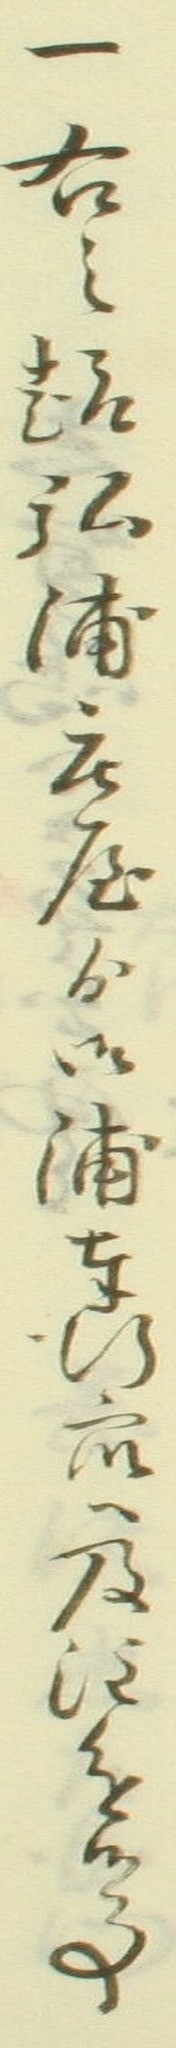一右之趣弘浦庄屋ゟ御浦奉行衆へ及注進候事
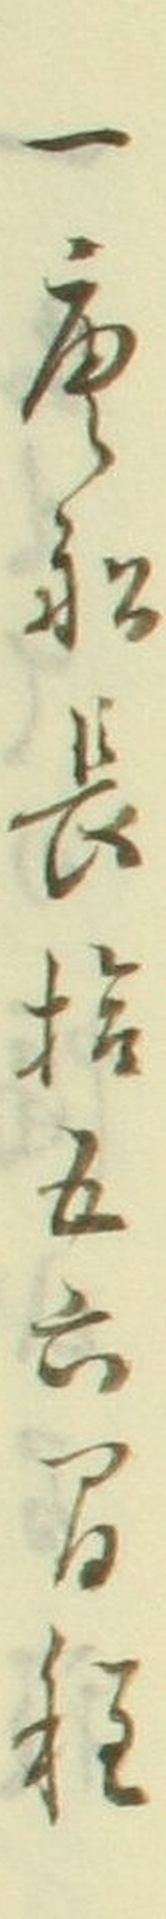一唐船長拾五六間程
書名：異国船漂着記
